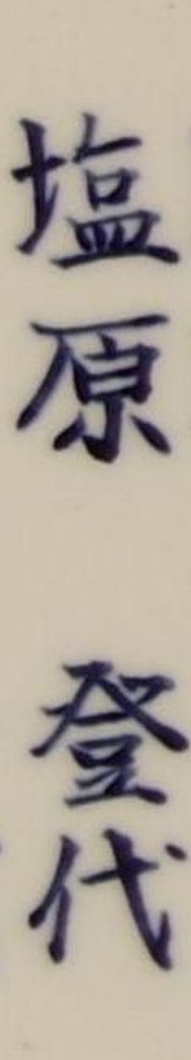塩原登代
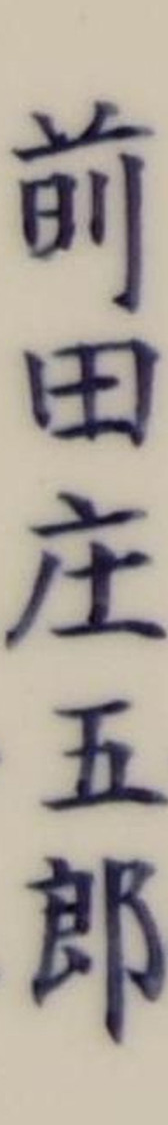前田庄五郎

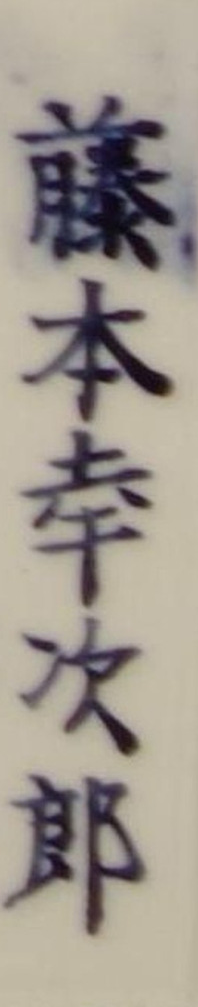藤本幸次郎
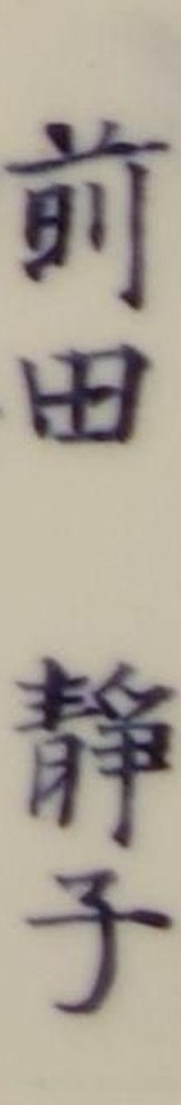前田静子
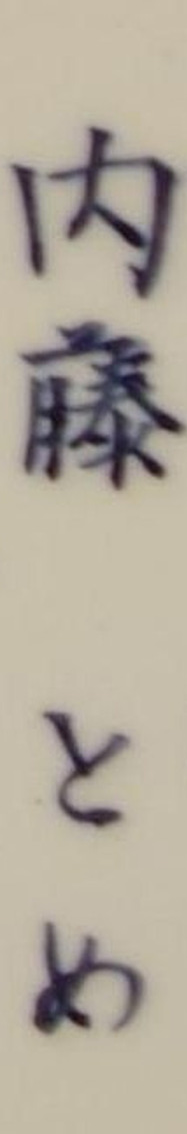内藤とめ
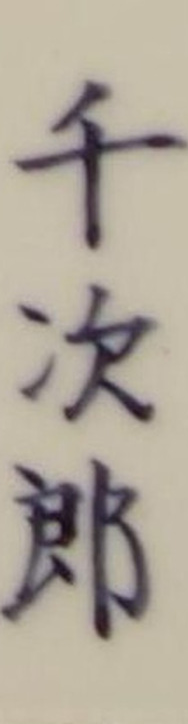千次郎
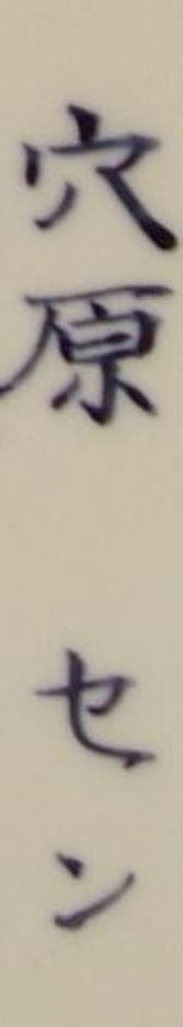穴原セン
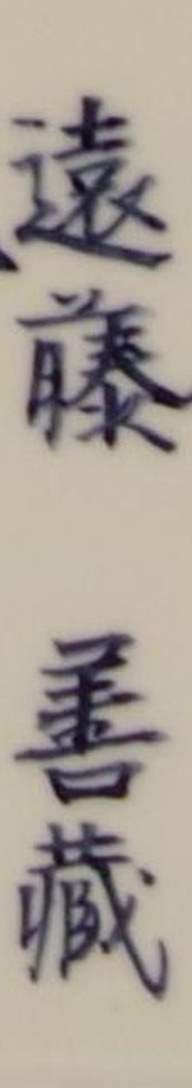遠藤善蔵
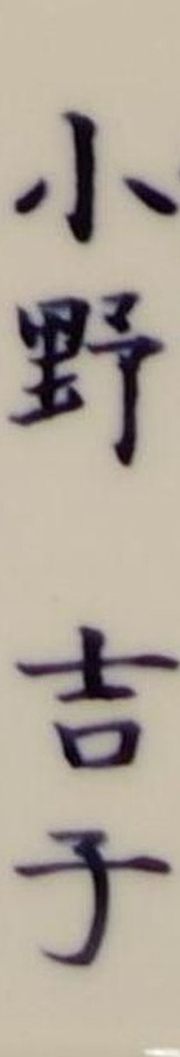小野吉子
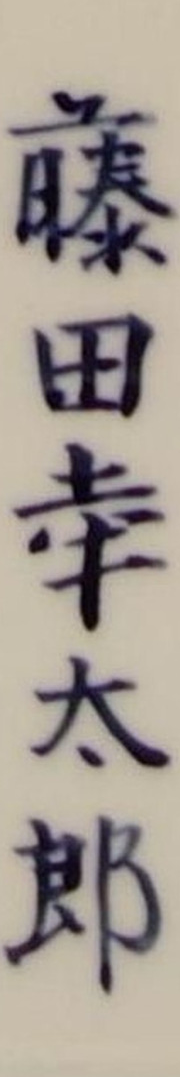藤田幸太郎
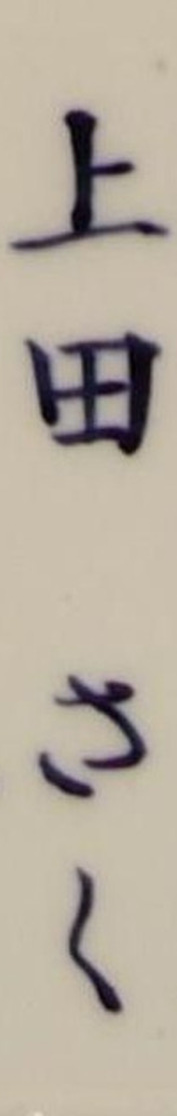上田さく
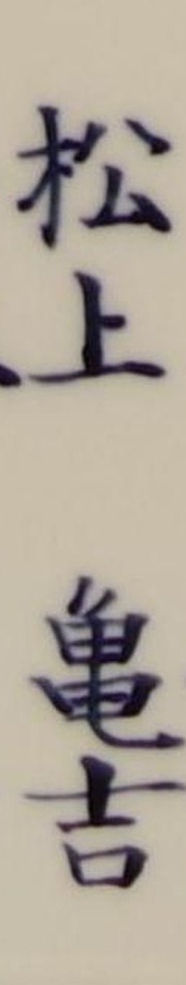松上亀吉
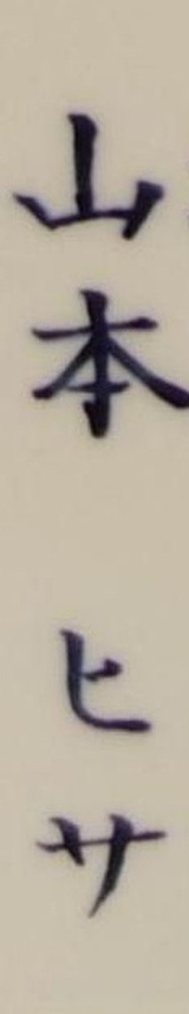山本ヒサ
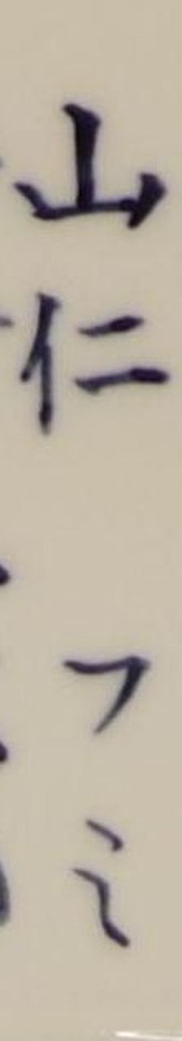山仁フミ
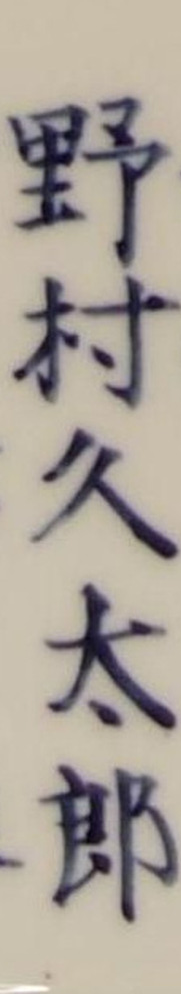野村久太郎
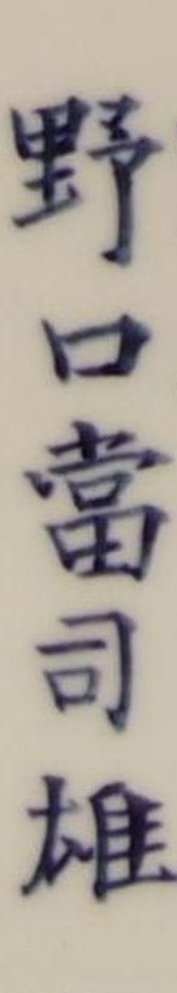野口當司雄
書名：M~S
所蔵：高野山金剛峯寺
